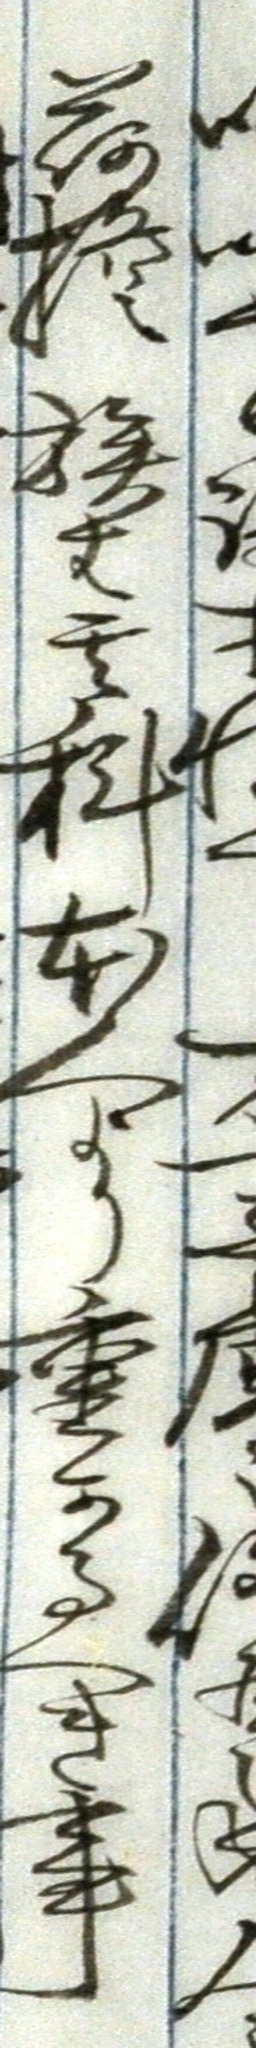荷担族者其科本人より重かるへき事
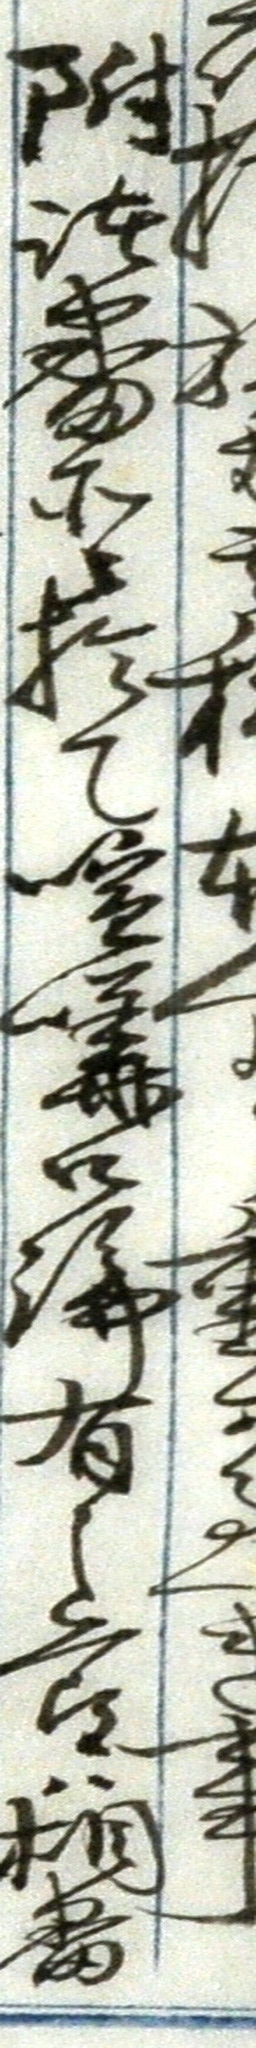附諸番所に於て喧嘩口論有之節は相番
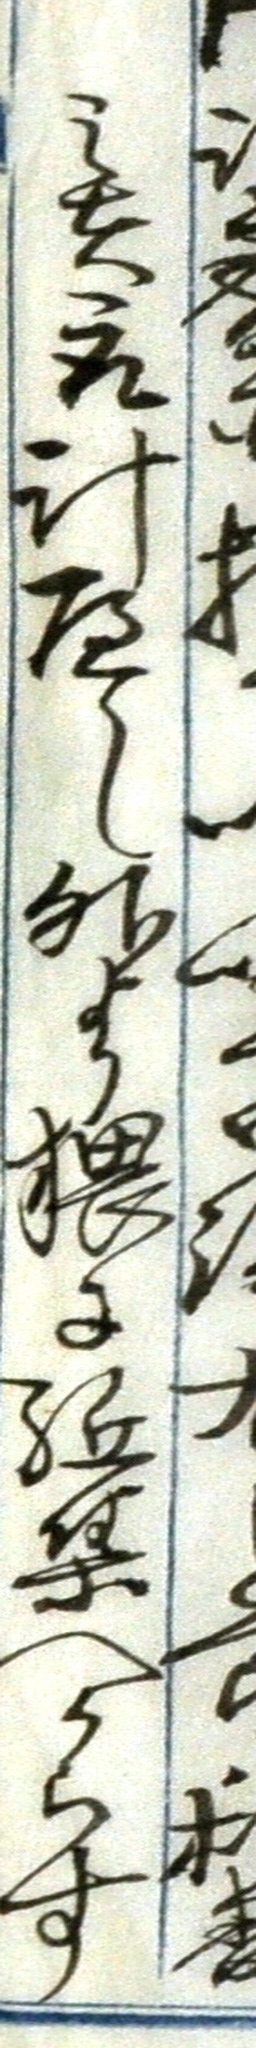之者取計へし外より猥に駆集へからす

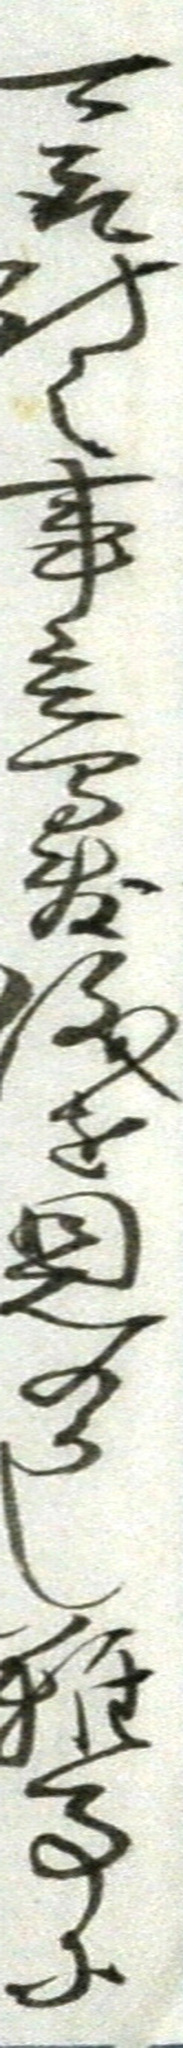可取計之事立間敷儀を見のかし難事に
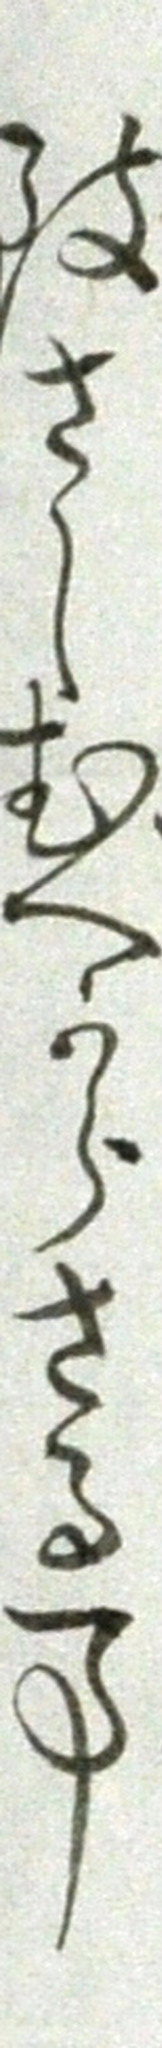致さしむへからさる事
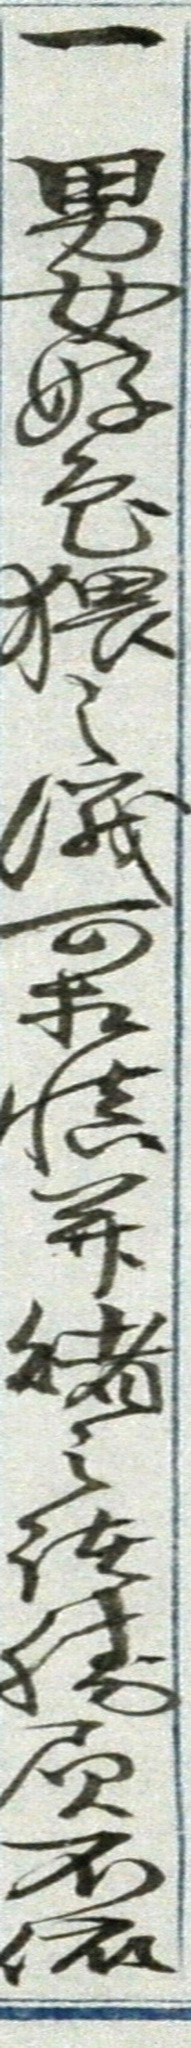一男女好色猥之儀可相慎并賭之諸勝負不依
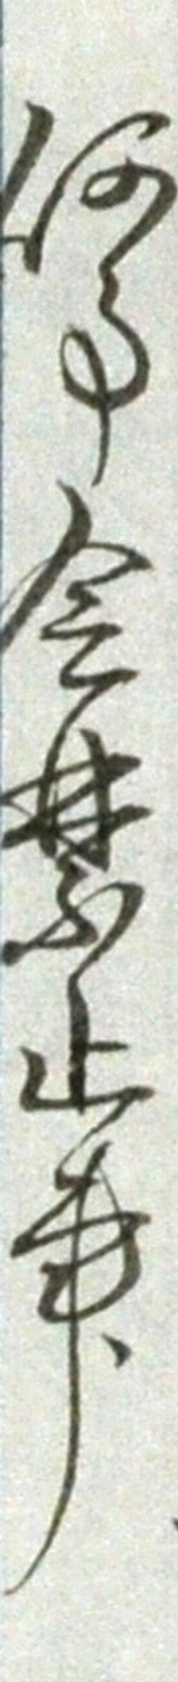何事令禁止事
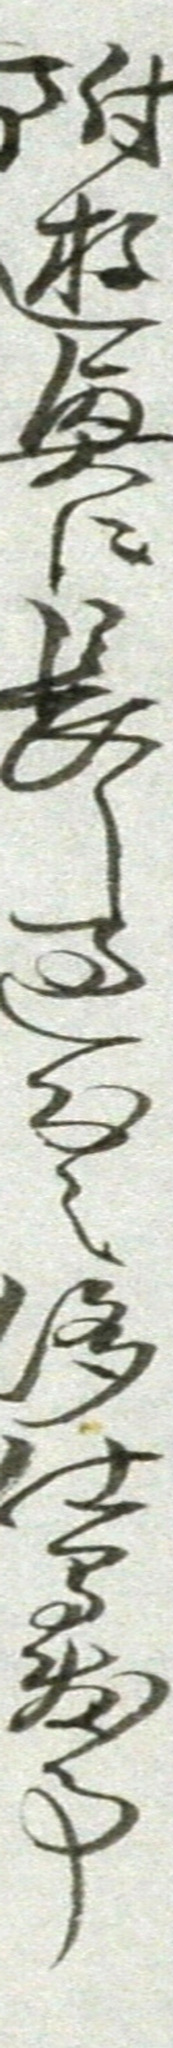附遊興に長し過分之侈仕間敷事
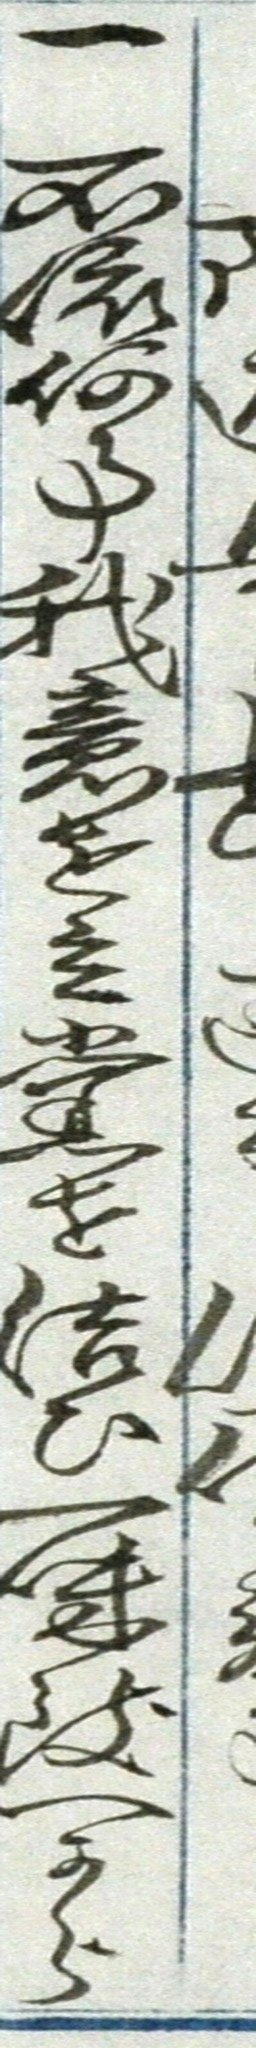一不依何事我意を立党を結ひ一味致へから
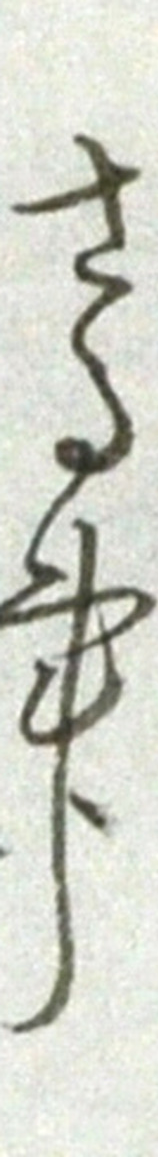さる事
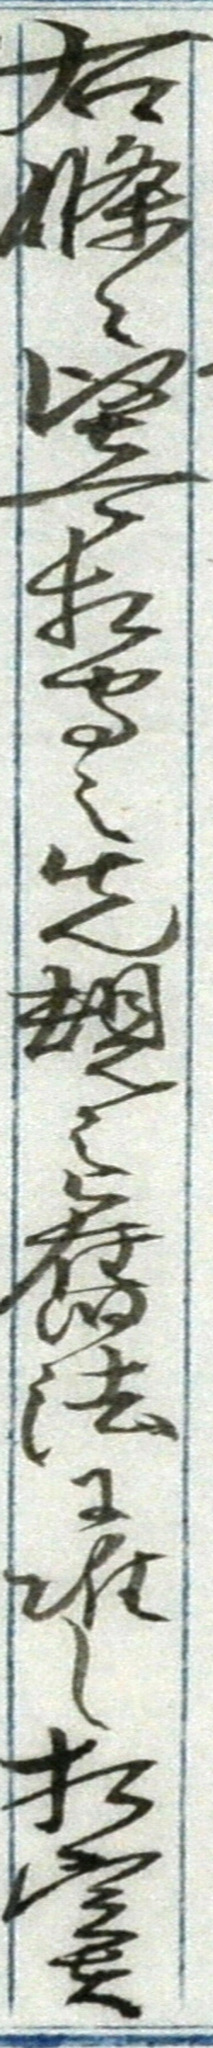右条々堅可相守之先規之旧法に准し相定者
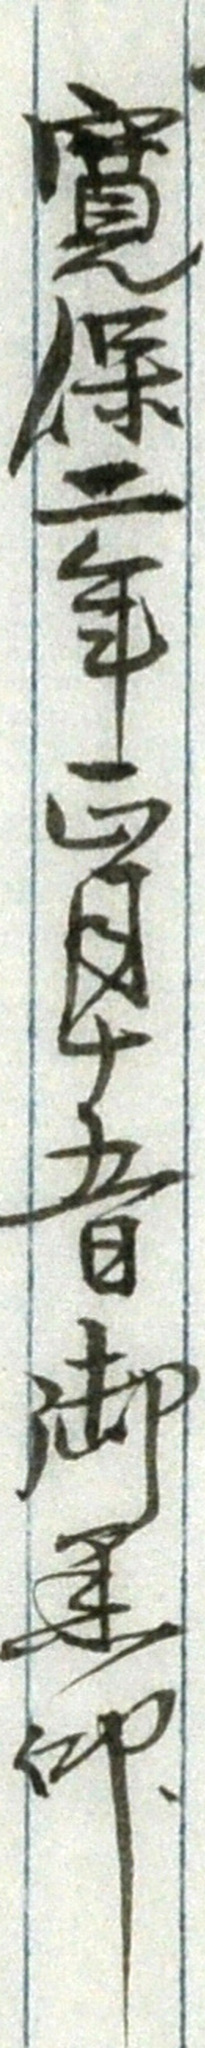寛保二年正月十五日御黒印
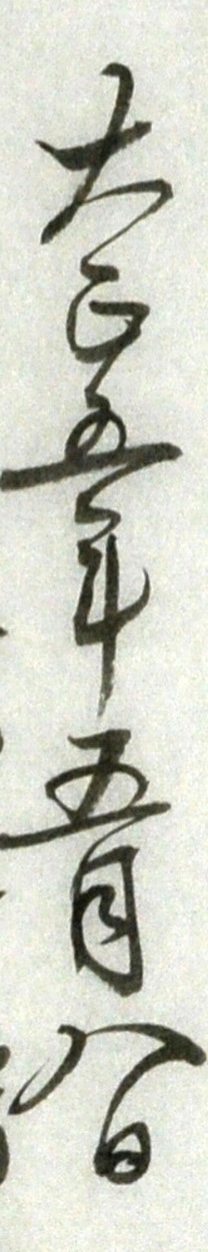大正五年五月八日
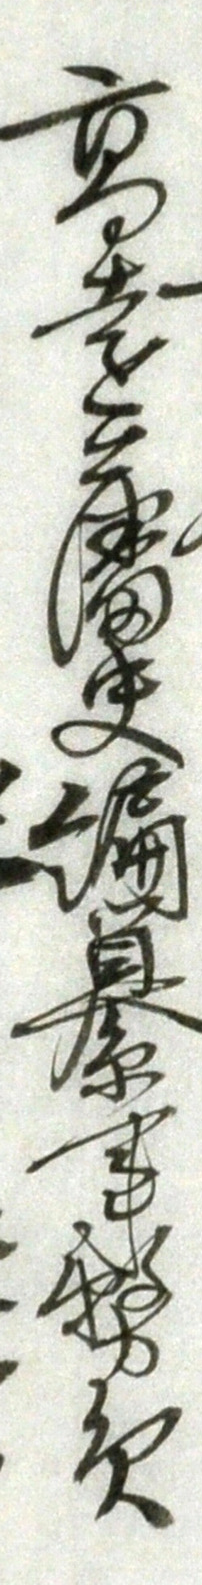高遠藩史編纂事務員
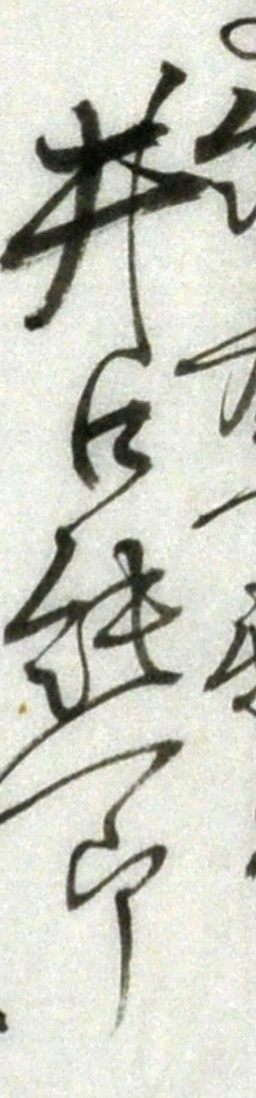井口純一郎
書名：頼由公御定之条々
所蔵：伊那市立高遠町図書館・合同会社AMANE
